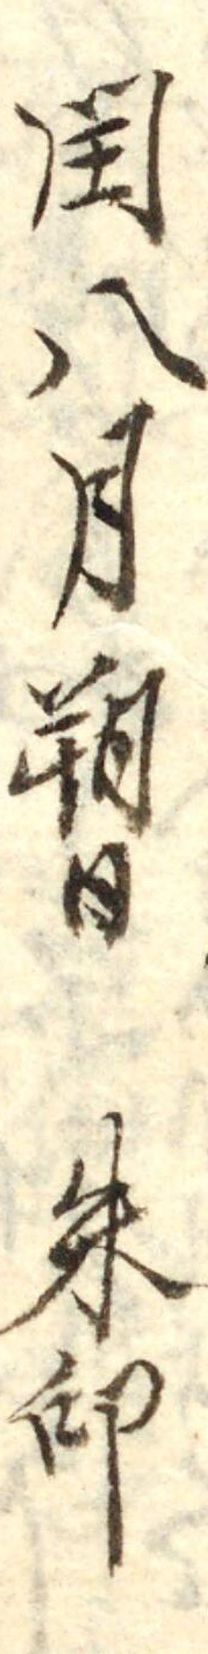閏八月朔日朱印
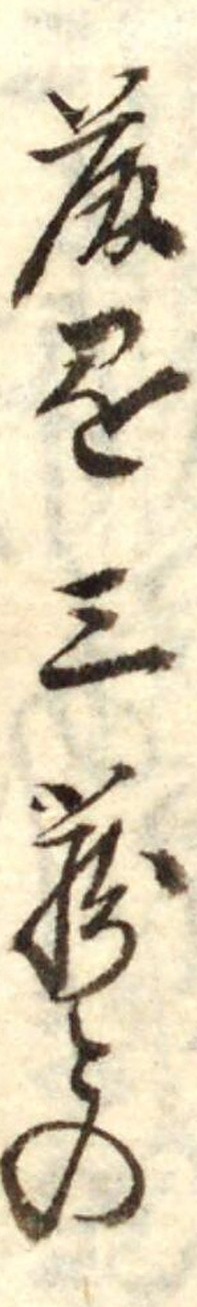藤懸三蔵との
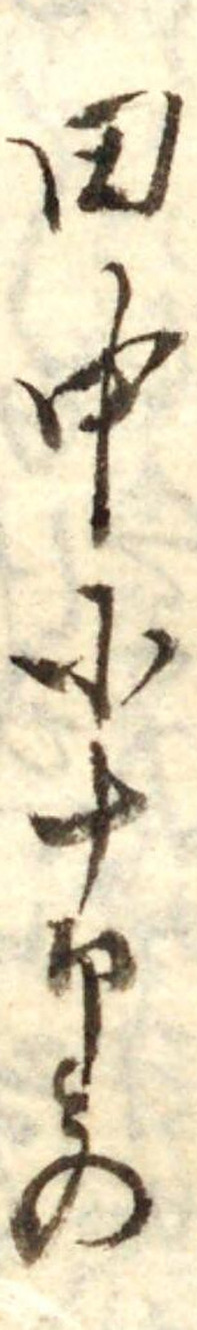田中小十郎との
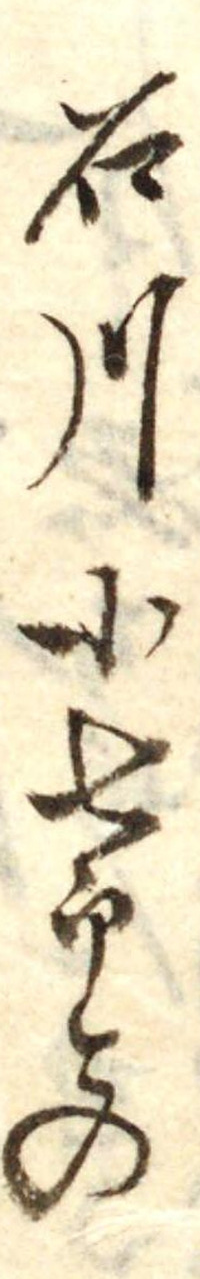石川小七郎との
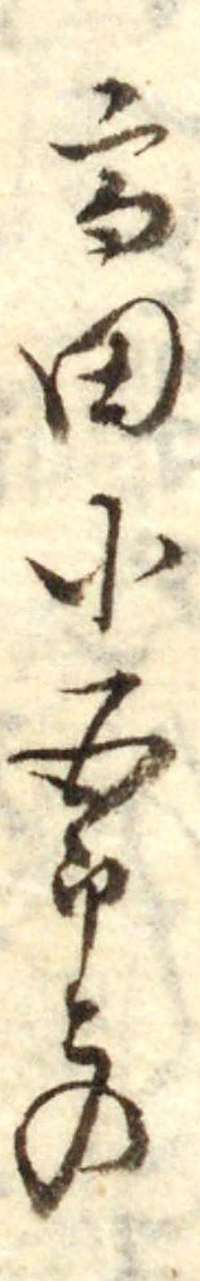高田小五郎との
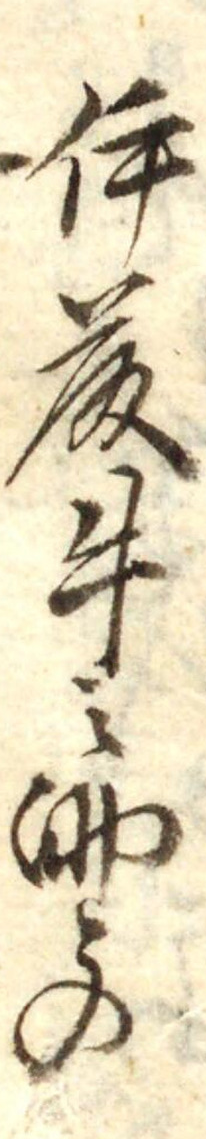伊藤牛之助との
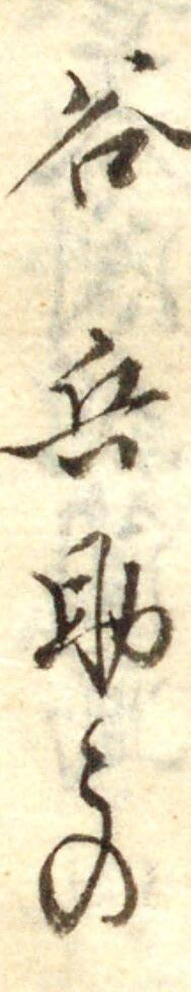谷兵助との

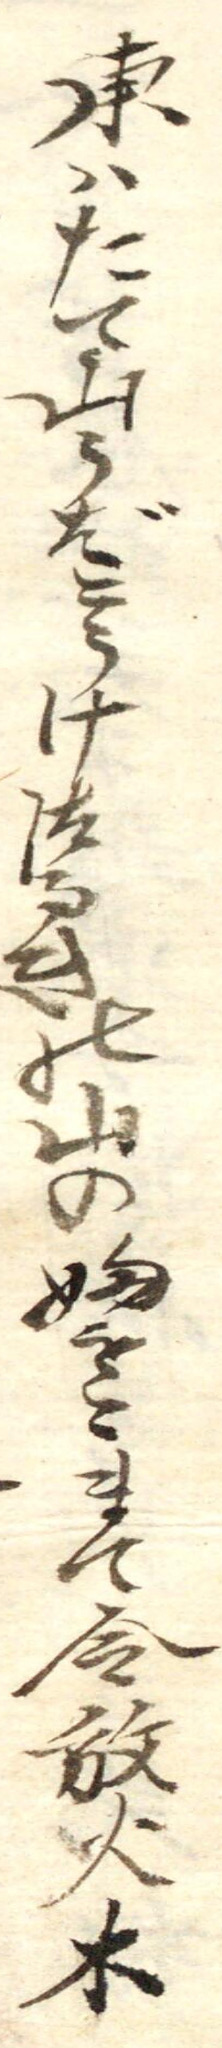東はたて山うだとうけ徒るき能山の婦もとまて令放火木
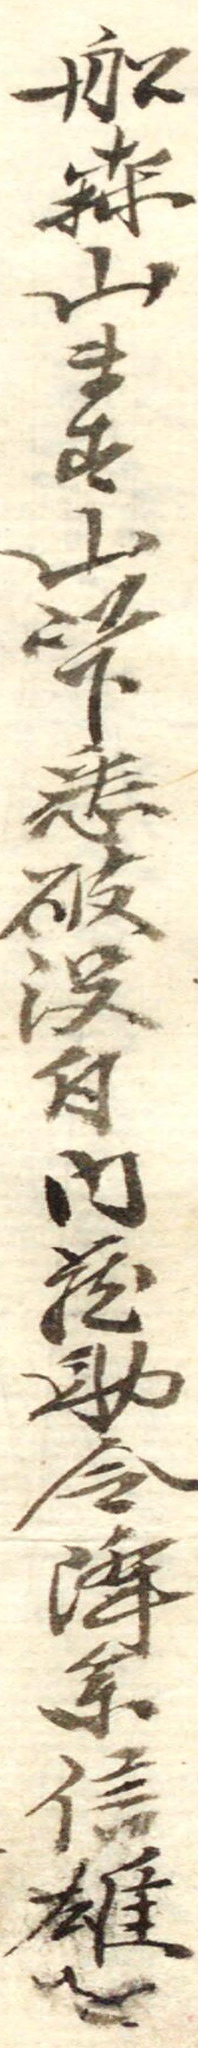舩森山ま春山以下悉破没付内蔵助令降参信雄を
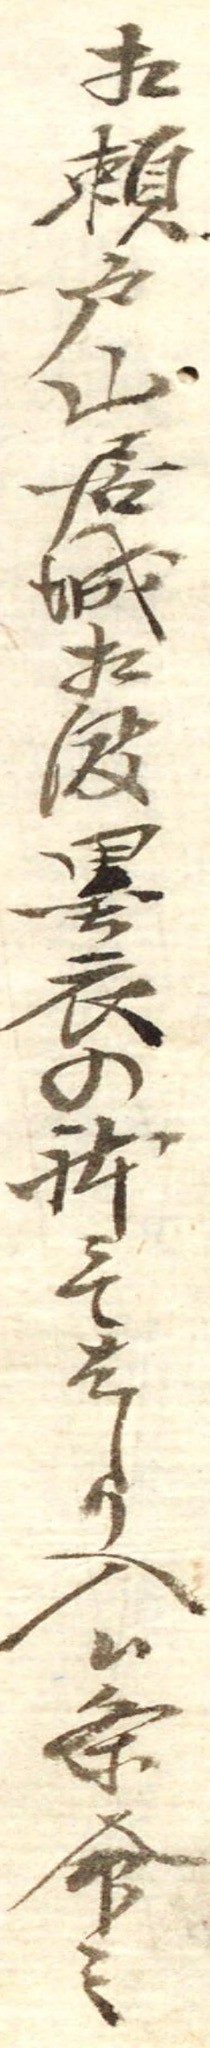相頼戸山居城相渡墨衣の躰にてはしり入候条命之
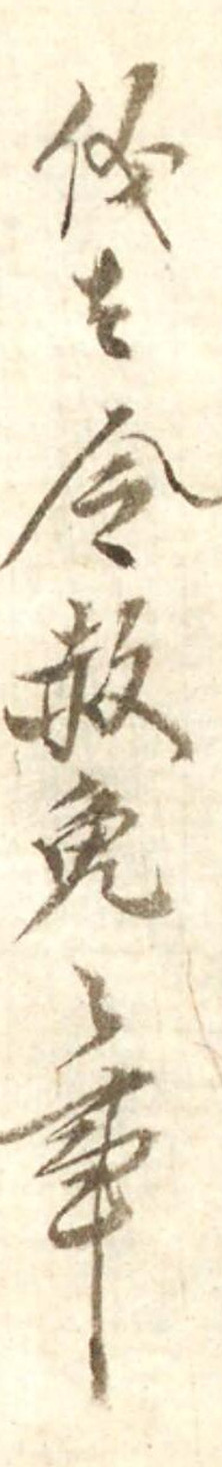儀を令赦免之事
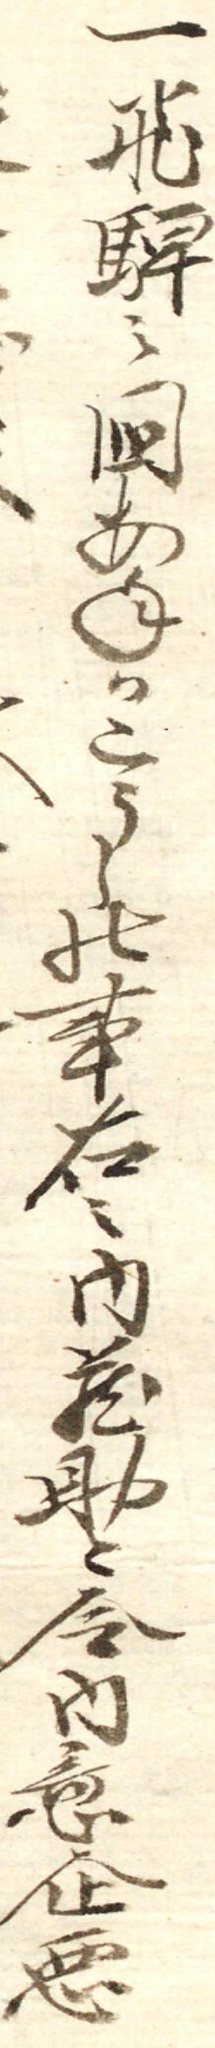一飛騨之国あ年かこうし能事右之内蔵助と令内意企悪
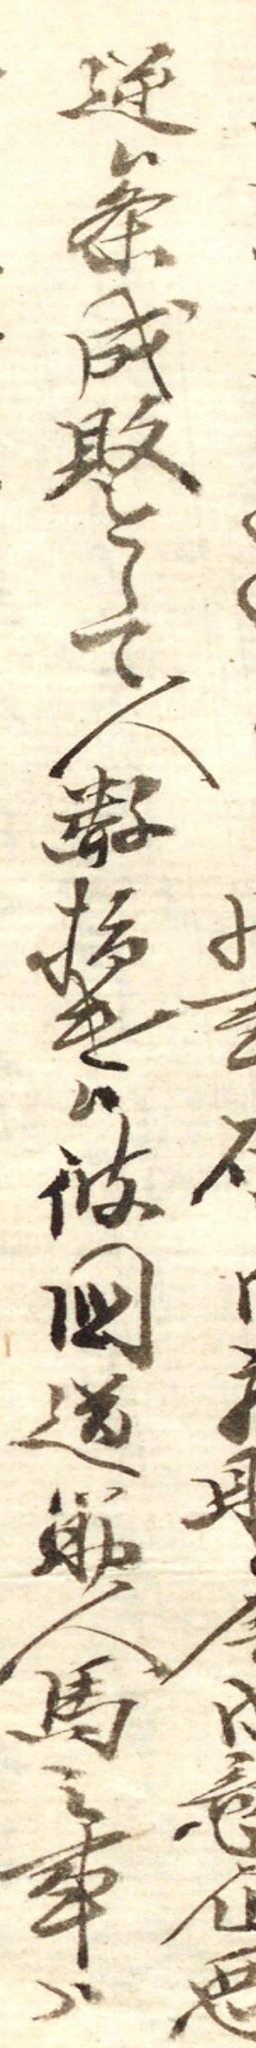逆候条成敗として人数指遣候彼国道筋人馬之事は
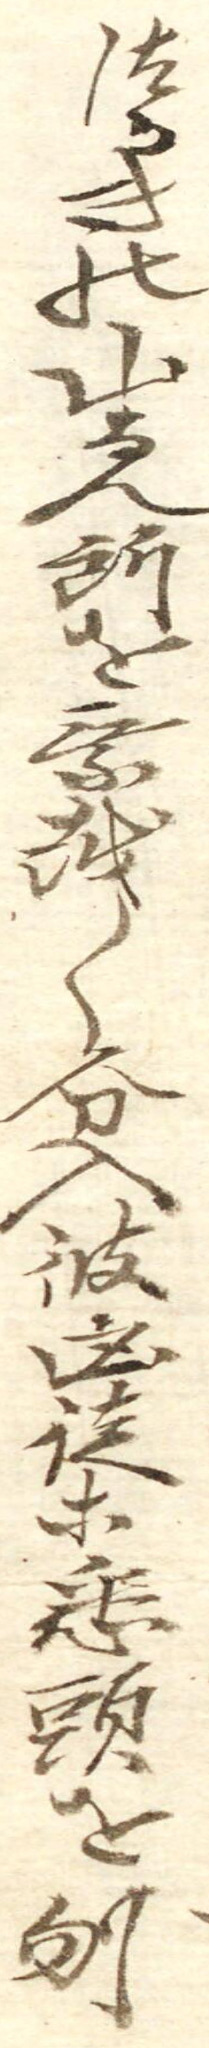徒るき能山なん所を乗越〳〵分入彼凶徒等悉頭を刎
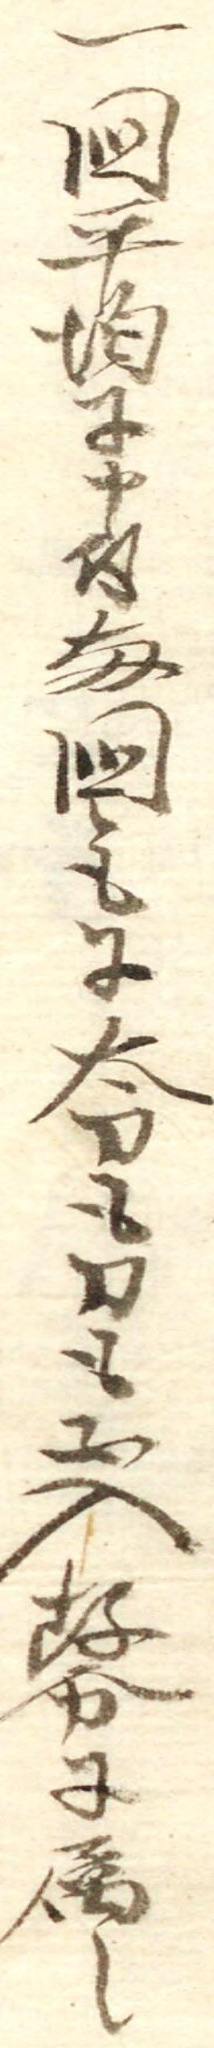一国平均尓申付両国とも尓太刀も刀もふ入存分尓属し
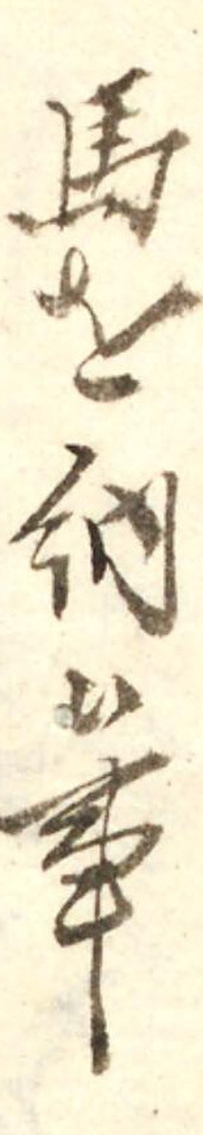馬を納候事
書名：前田家封国証書集録
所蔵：Ishikawa Prefectural Library
